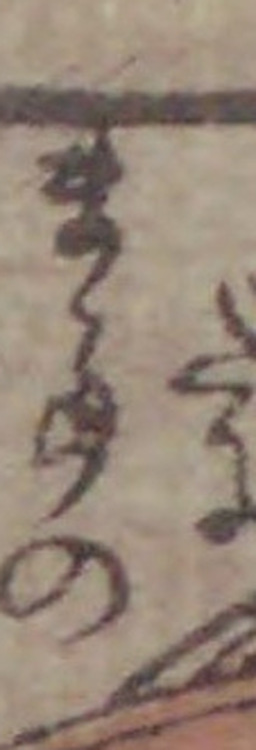ま事の
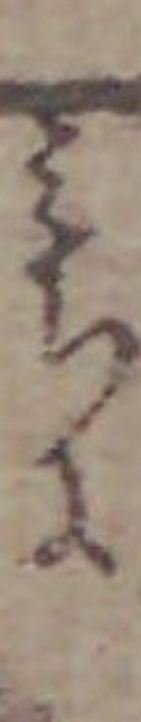みちに
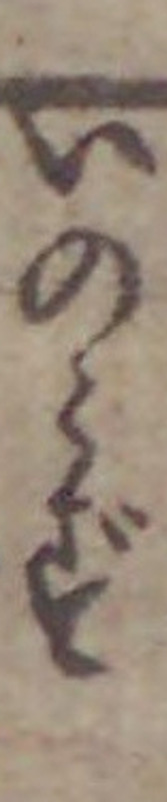いのらず
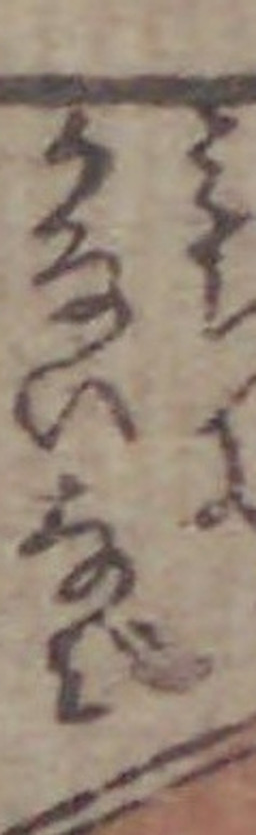かないなば
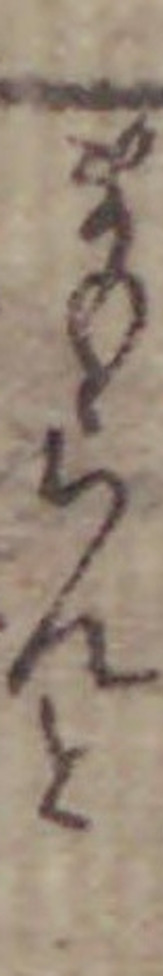まもらんと
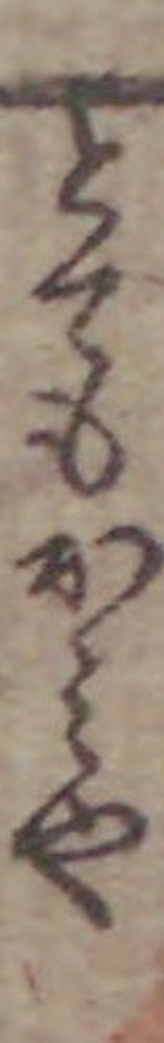とてもかみや
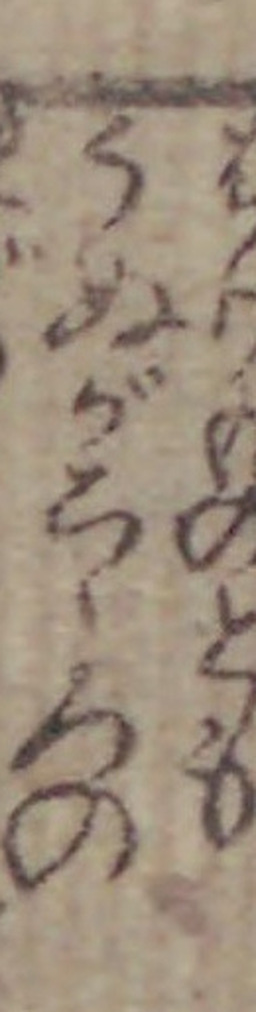うぬがこゝろの
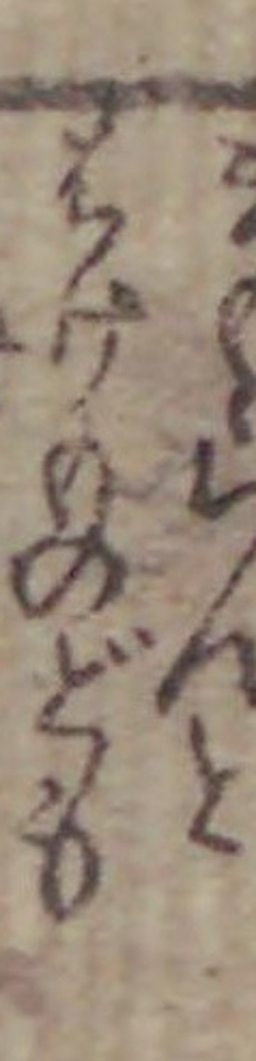はけものども
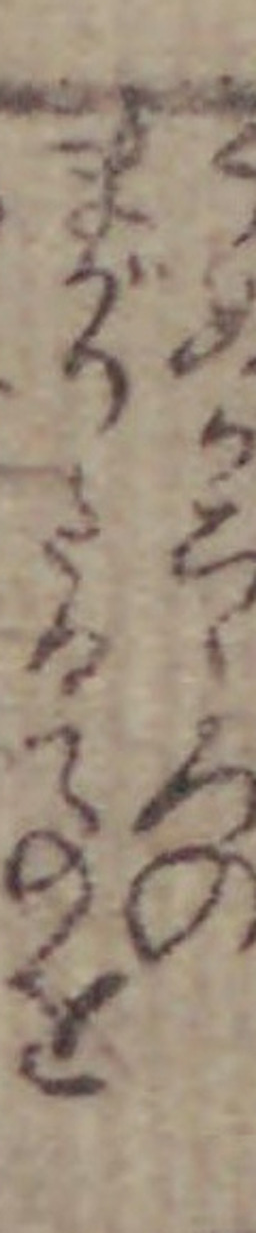まがりたる事を
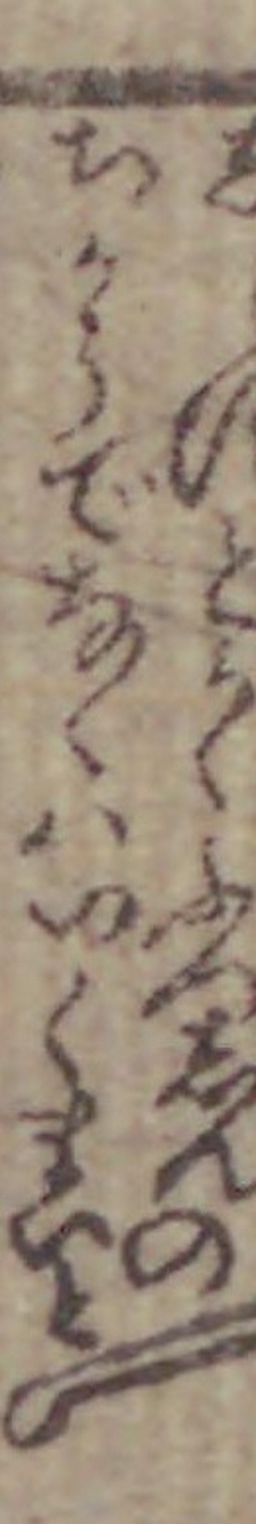ちからでなくはいくまいと
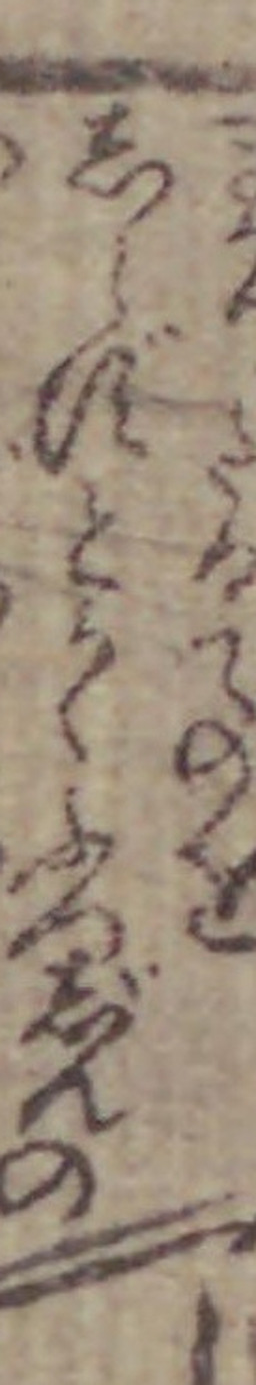しらずとかくふつじんの
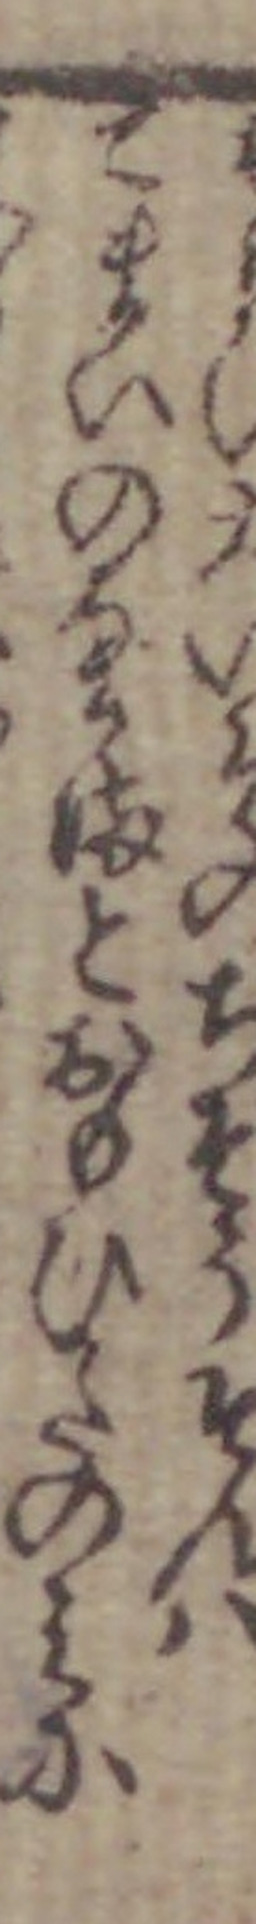てまいのなかまとおもひたのみに
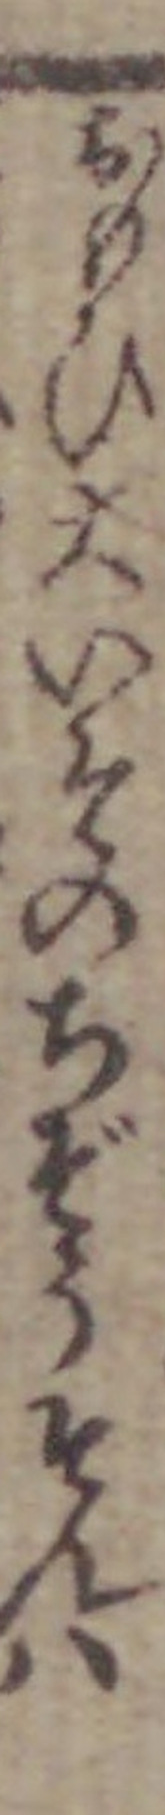おもひ大いそのちぞうそんは
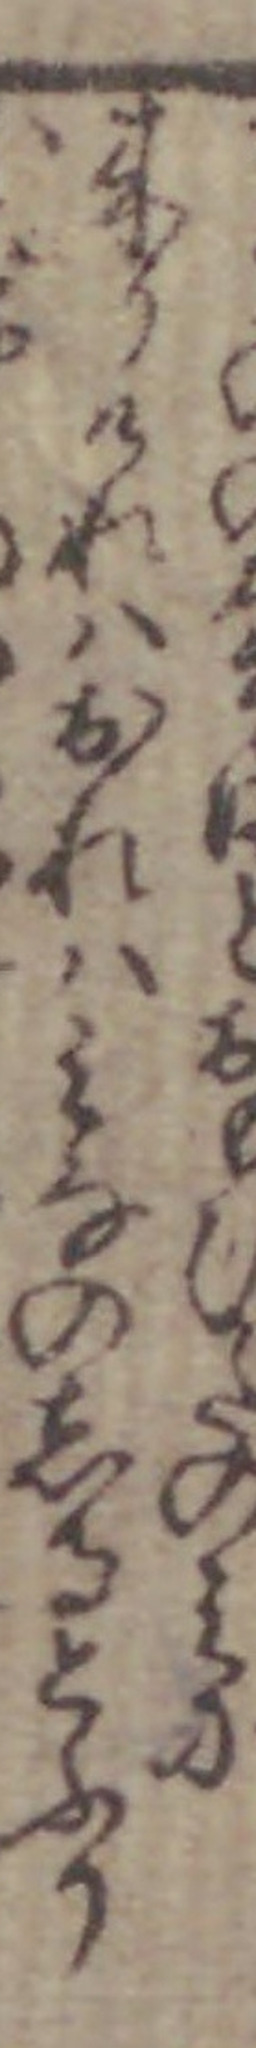来りけれはおれはみなのしるとふり
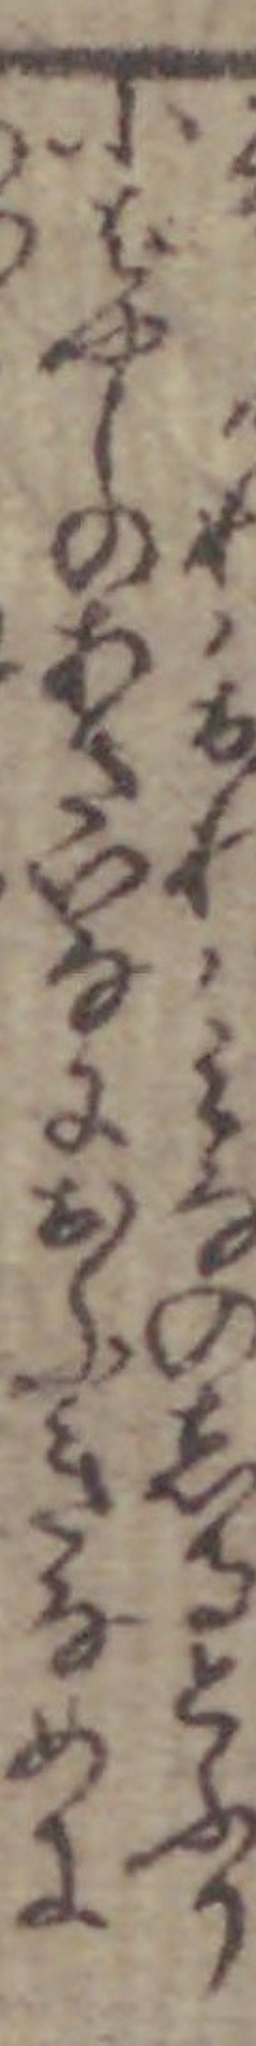小ばやしのあさいなにおふきなめに
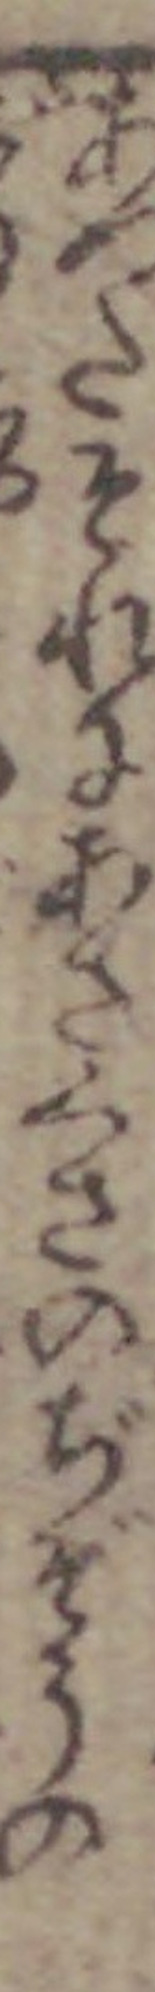あつたそれにあさくさのじぞうの
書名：化物鼻がひしげ 2巻
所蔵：国立国会図書館 National Diet Library, JAPAN
